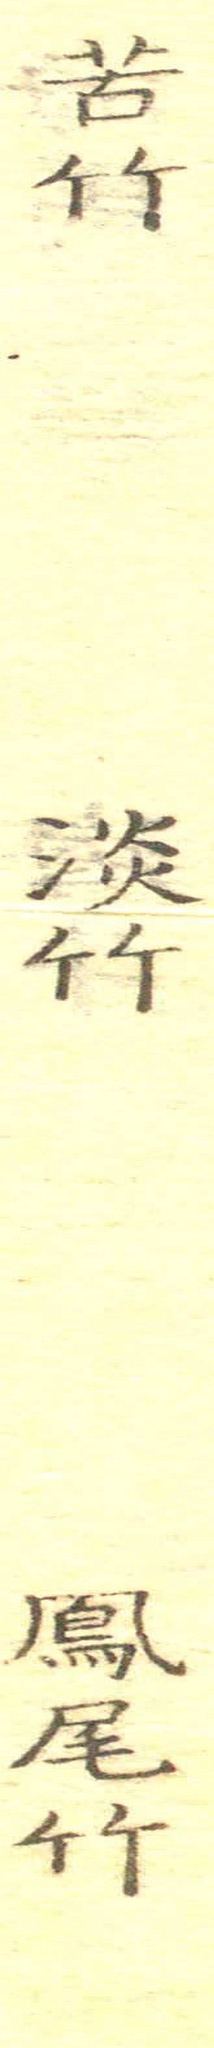苦竹淡竹鳳尾竹

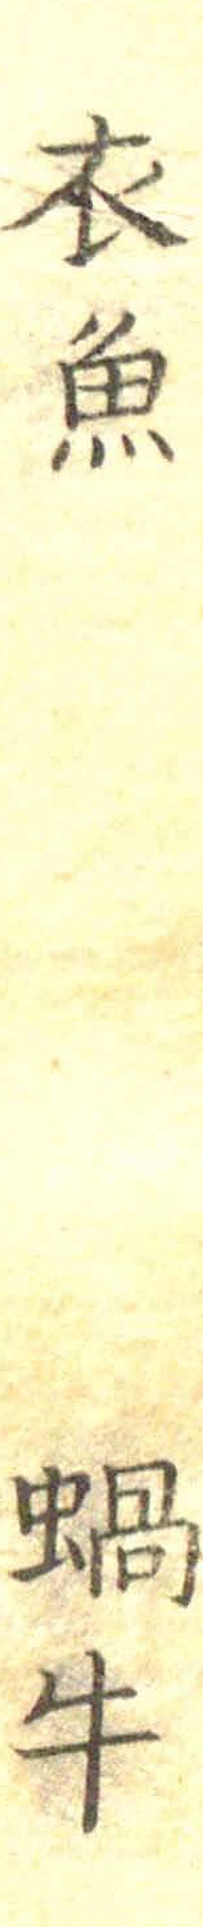衣魚蝸牛
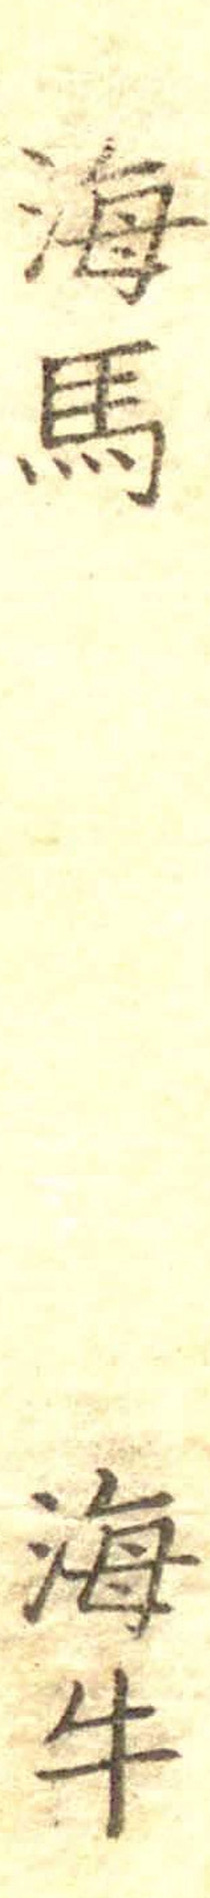海馬海牛
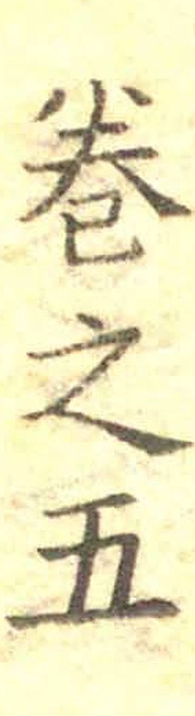巻之五
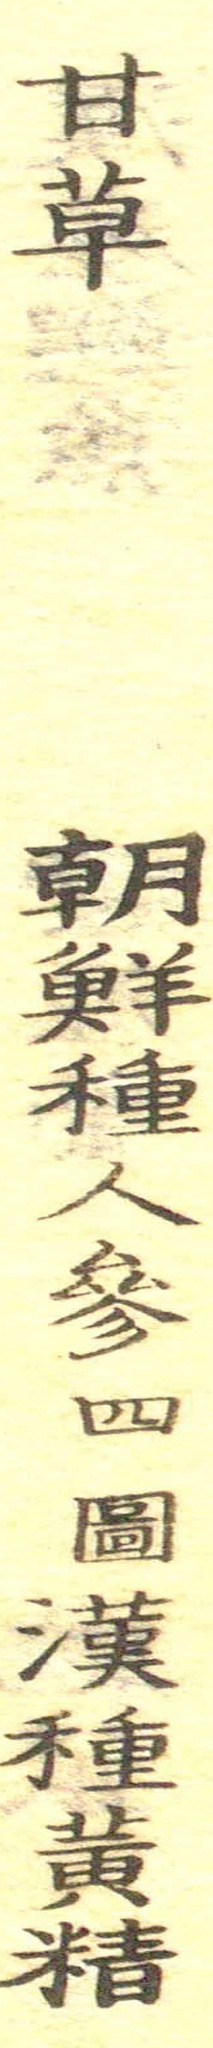甘草朝鮮人参四図漢種黄色精
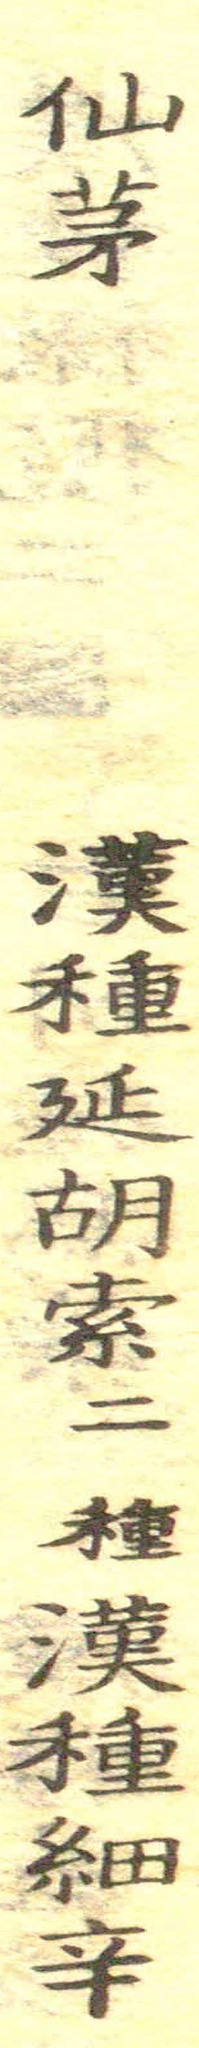仙茅漢種延胡索二種漢種細辛
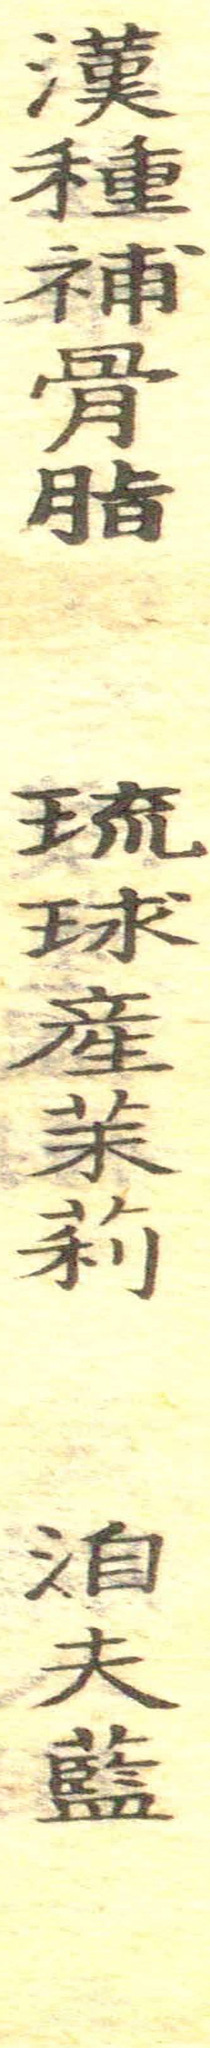漢種補骨脂琉球産茉莉洎夫藍
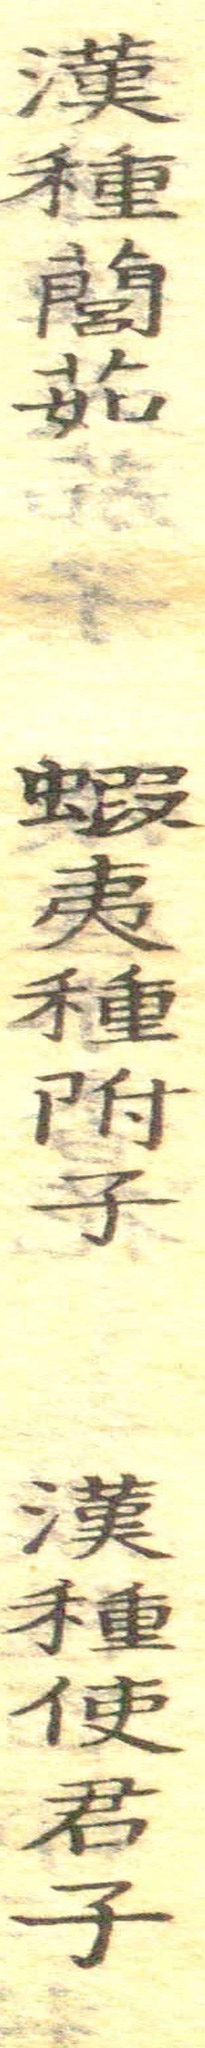漢種䕡茹蝦夷種附子漢種使君子

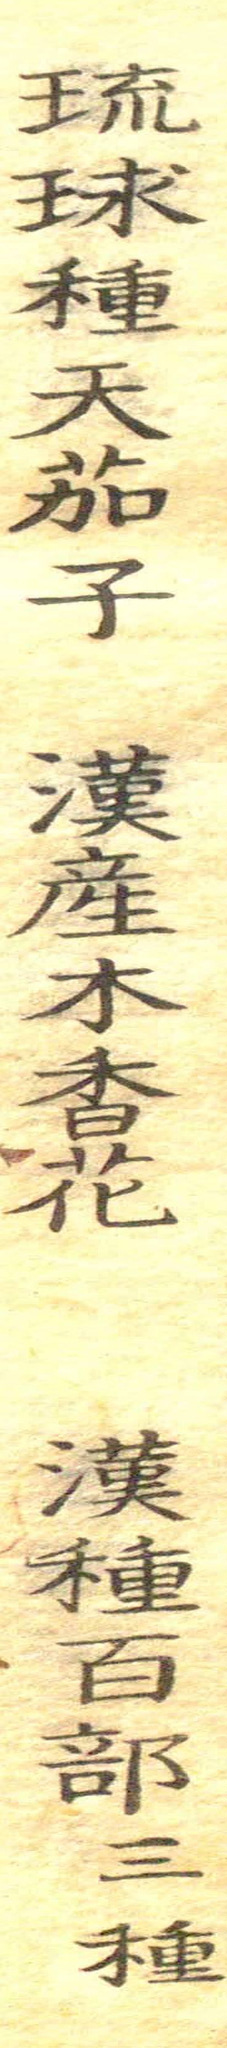琉球種天茄子漢産木香花漢種百部三種
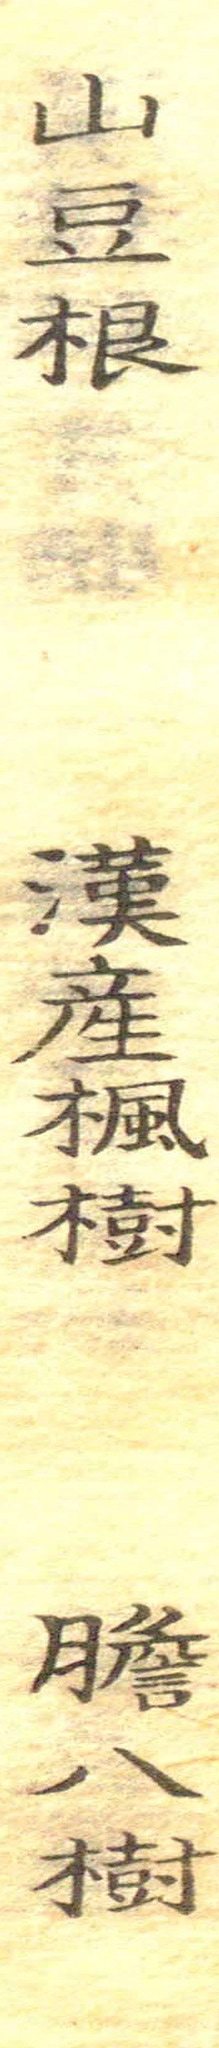山豆根漢産楓樹胆八樹
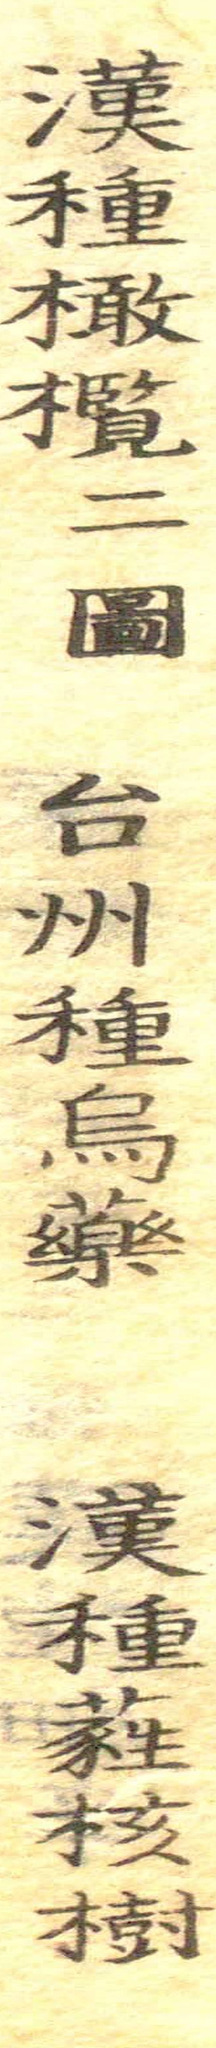漢種橄欖二図台州種烏薬漢種蕤核樹
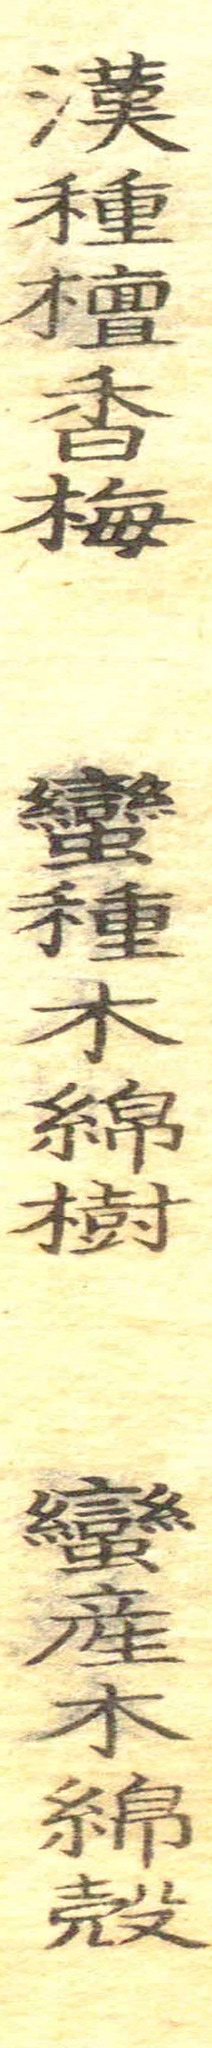漢種檀香梅蛮種木綿樹蛮産木綿殻
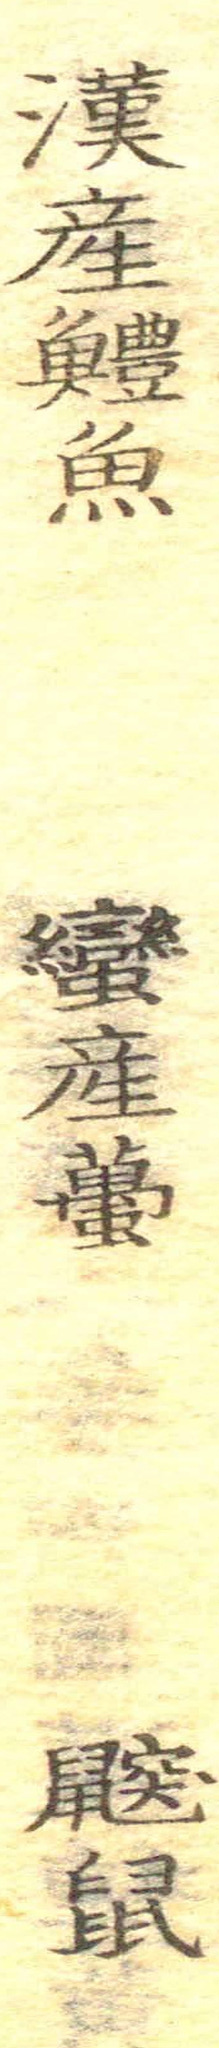漢産鱧魚蛮産蠆鼵鼠
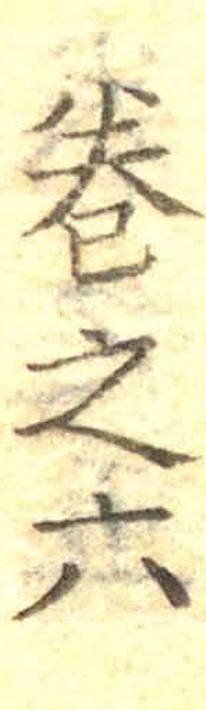巻之六
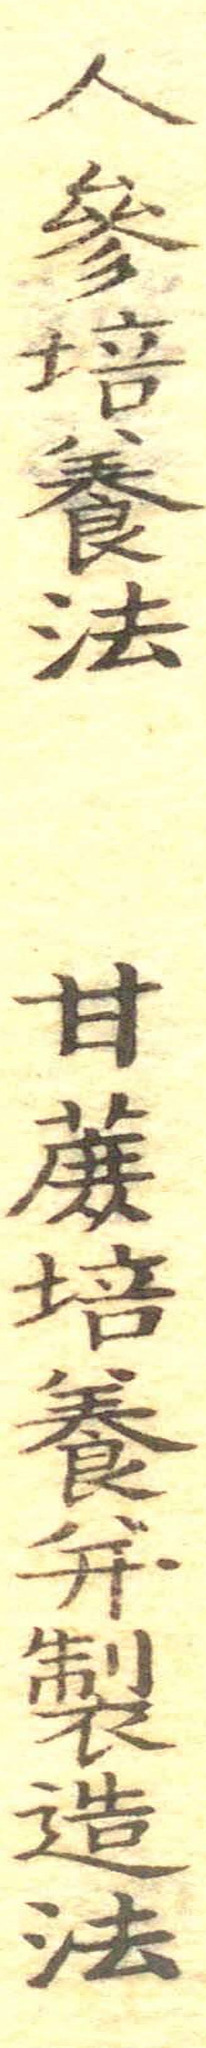人参培養法甘蔗培養并製造法
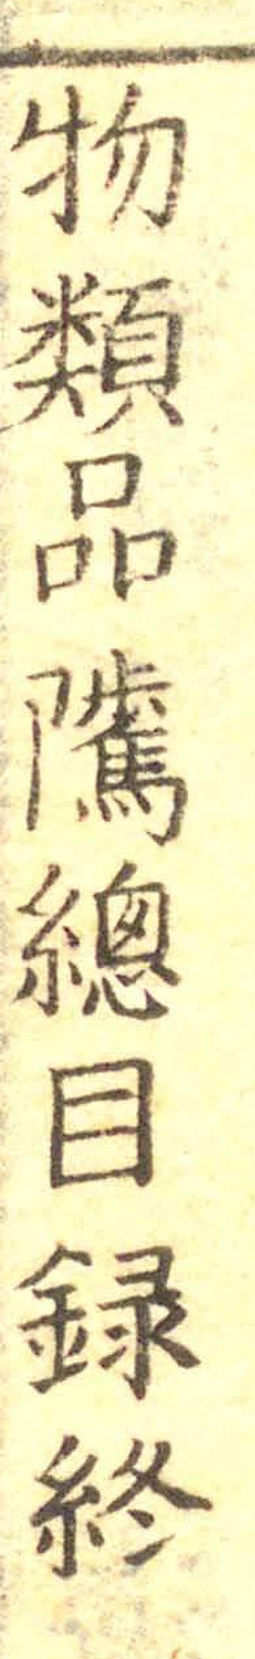物類品隲総目録終
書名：物類品隲
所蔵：国文学研究資料館
